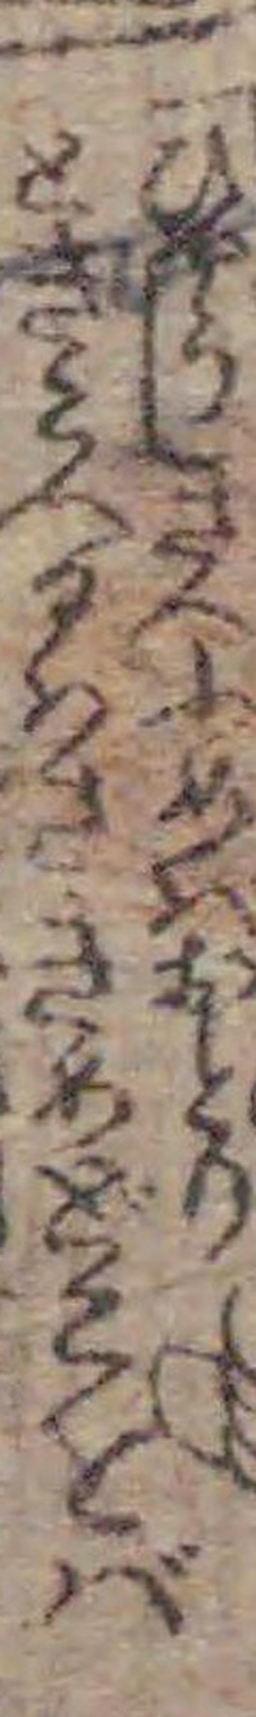ときこへるはさきめどこをば
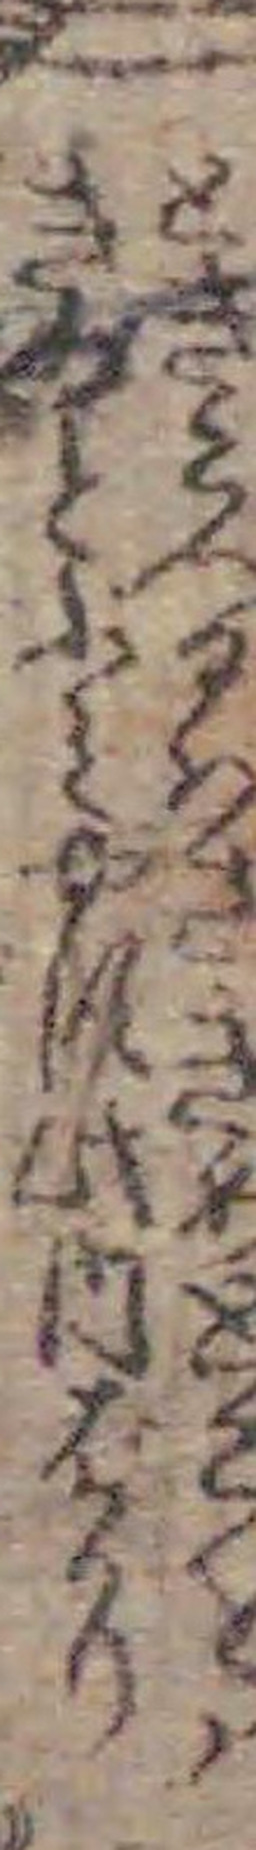きつとふみやす此内ばかり
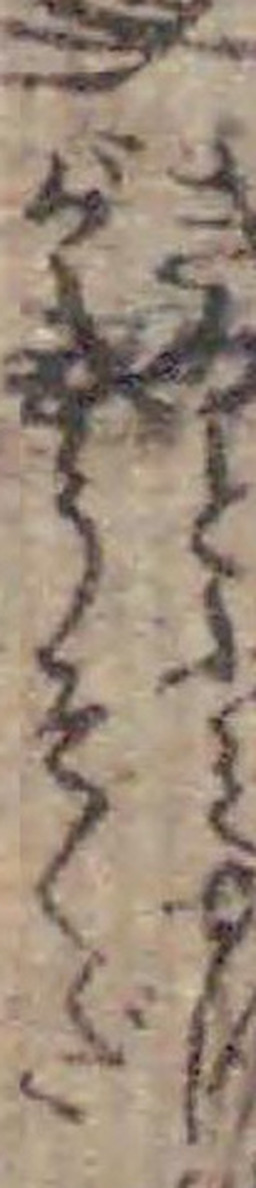がきうそくだ
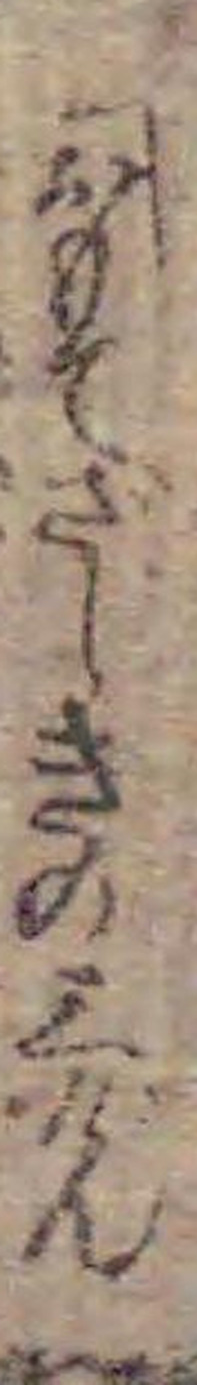〽おもてざしきの三げん
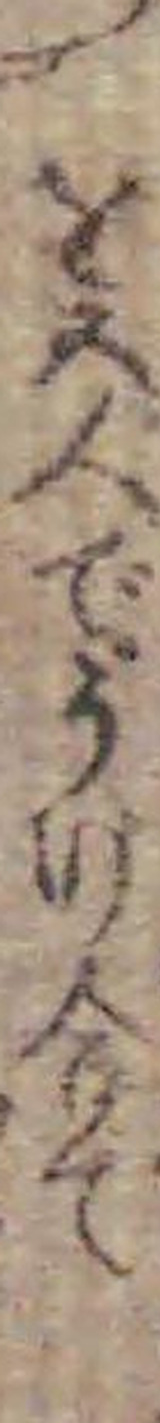を五人でうけ合て
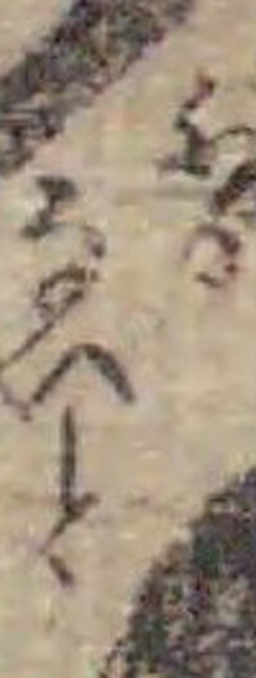ないと

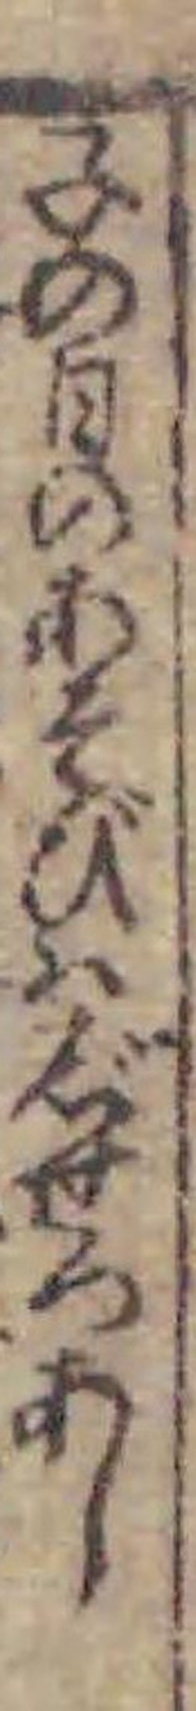子の日のあそびはじせつあし
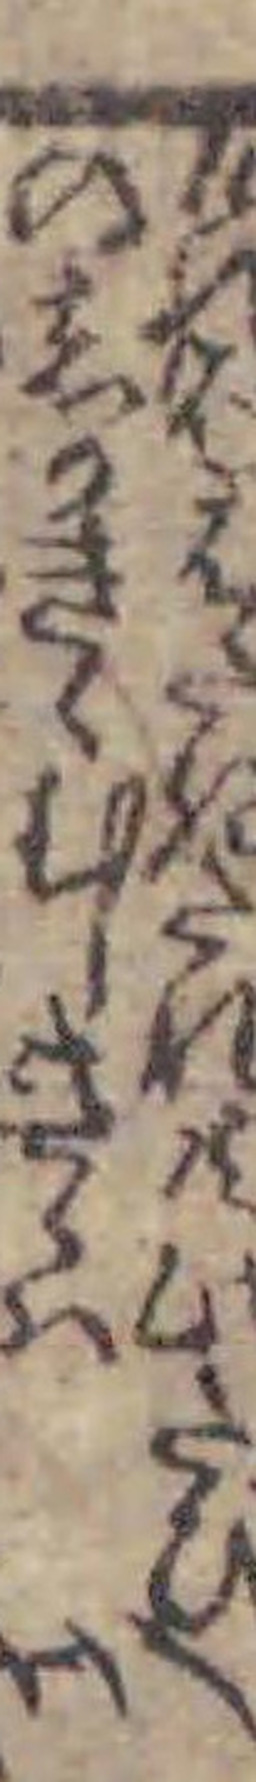のしかきゝむしきゝは
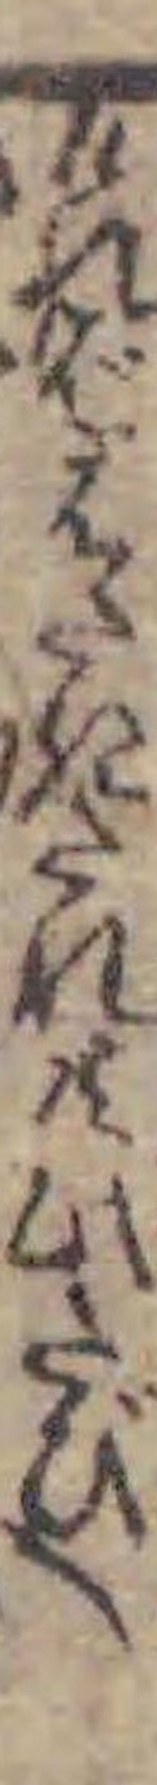ければはたきたれ共此たび
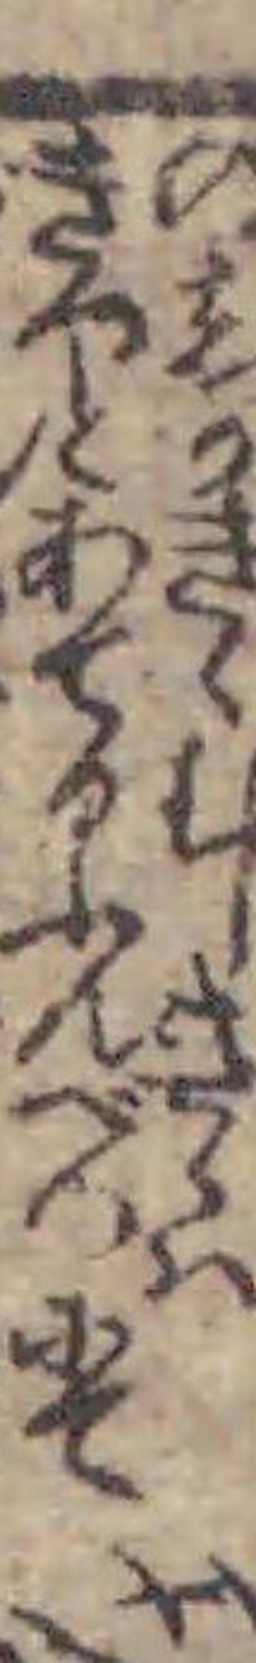きつとあてるふんべつにて
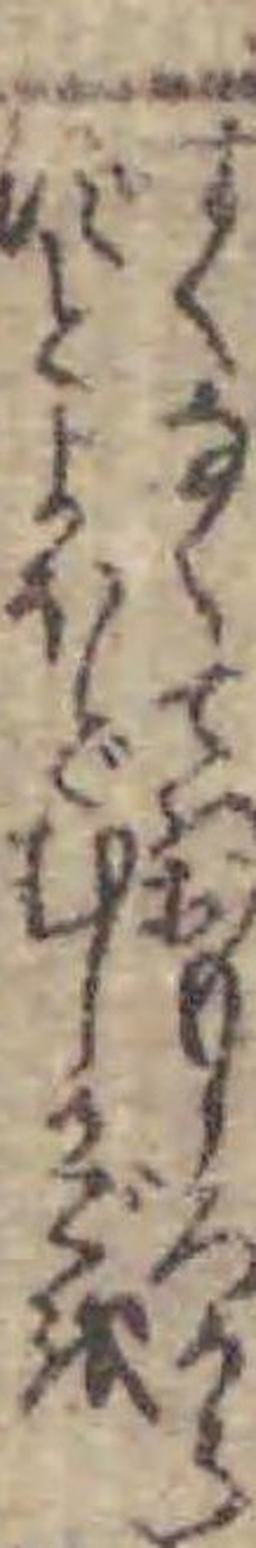ずとよほどむしかごを
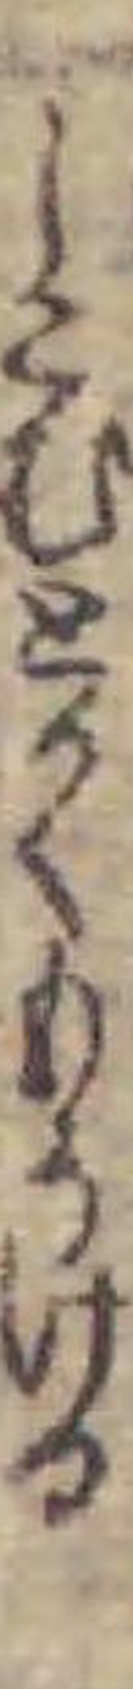しこむとかくもうける
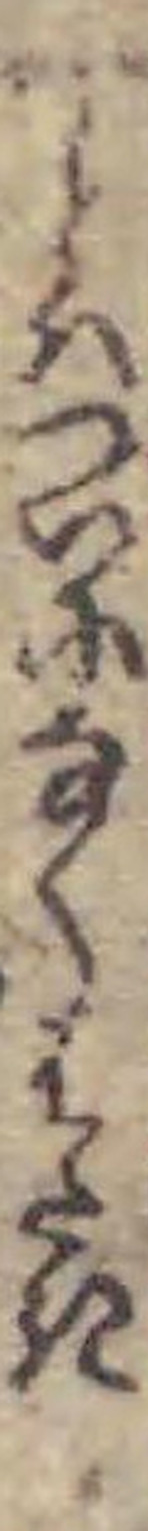ことはついになくはたき
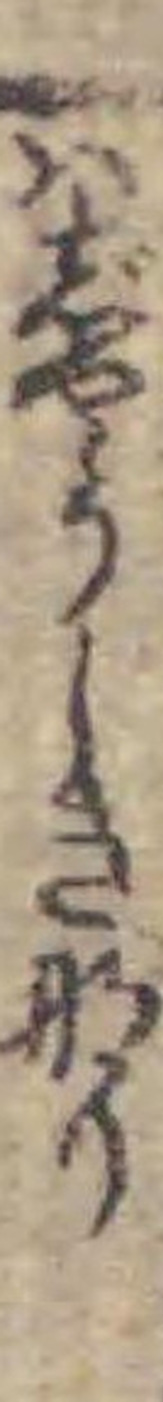はじやうしきなり
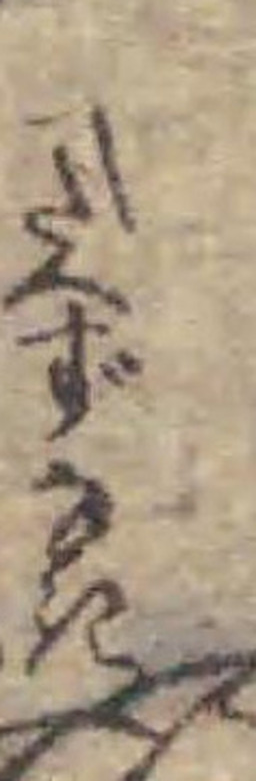〽たへずなき
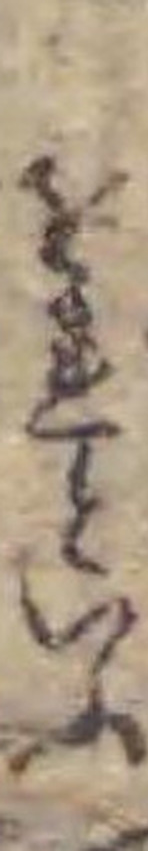をれといふ
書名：本樹真猿浮気噺 : 3巻
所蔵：国立国会図書館 National Diet Library, JAPAN
